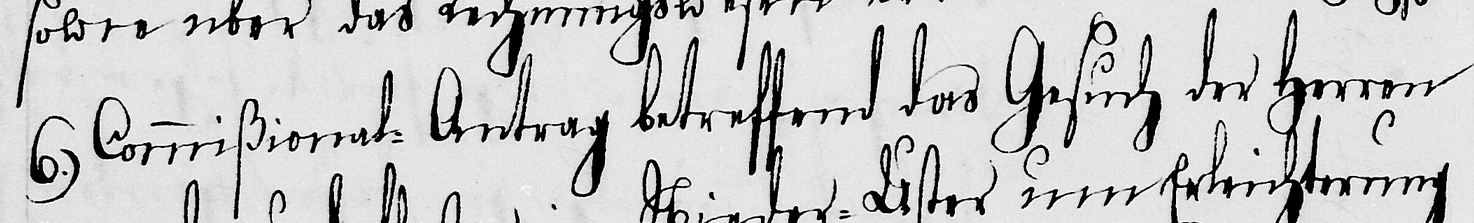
6.) Commißional-Antrag betreffend das Gesuch der Herren
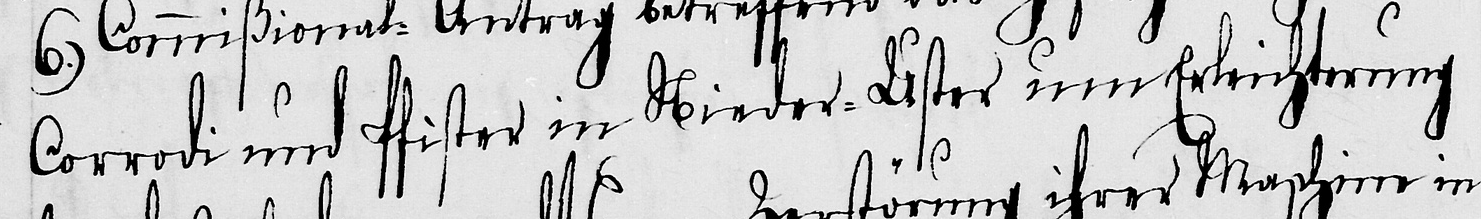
Corrodi und Pfister in Nieder-Uster um Erleichterung
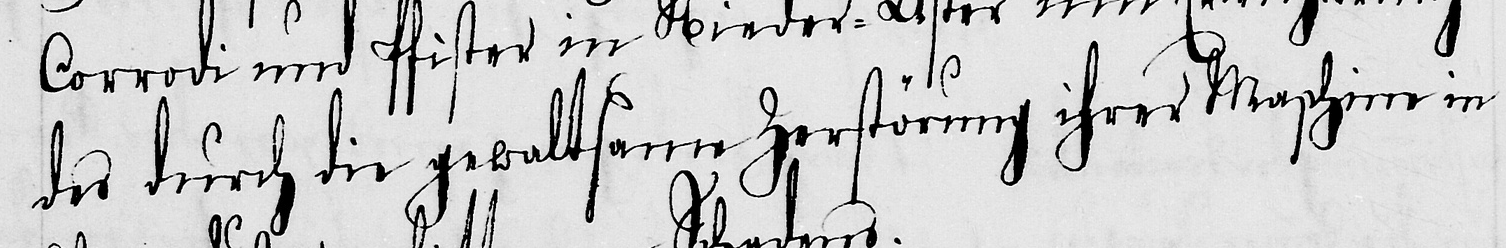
des durch die gewaltsame Zerstörung ihrer Maschine in
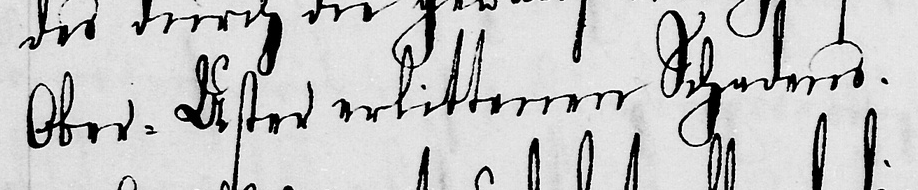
Ober-Uster erlittenen Schadens.
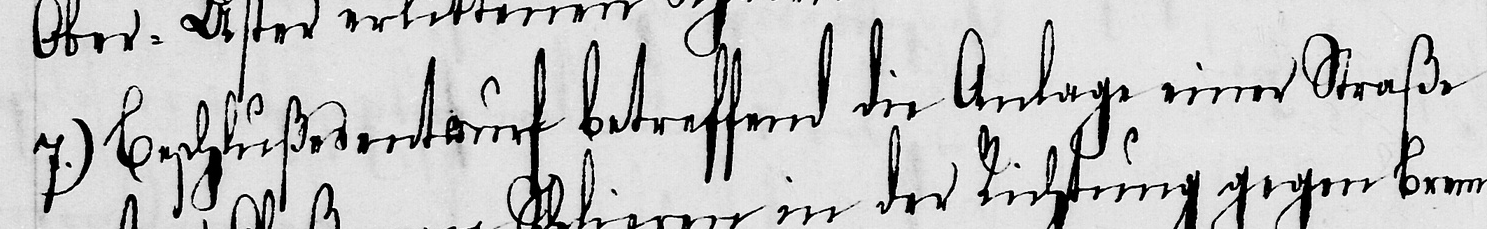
7.) Beschlußesentwurf betreffend die Anlage einer Straße
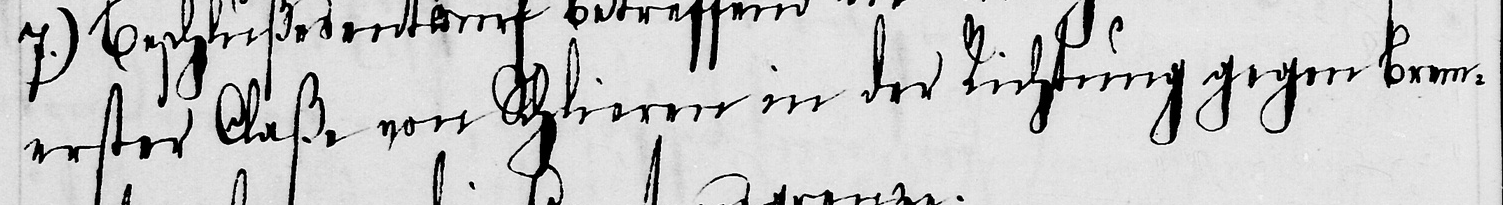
erster Claße von Schlieren in der Richtung gegen Brem¬
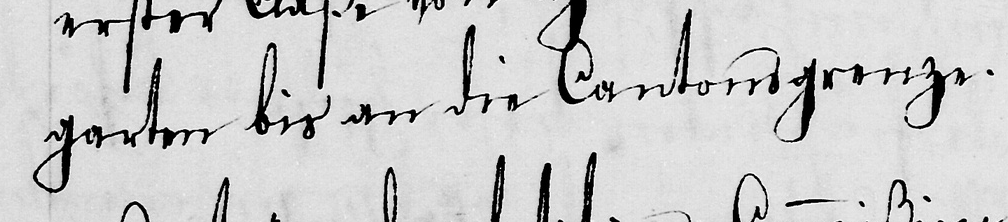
garten bis an die Cantonsgrenze.
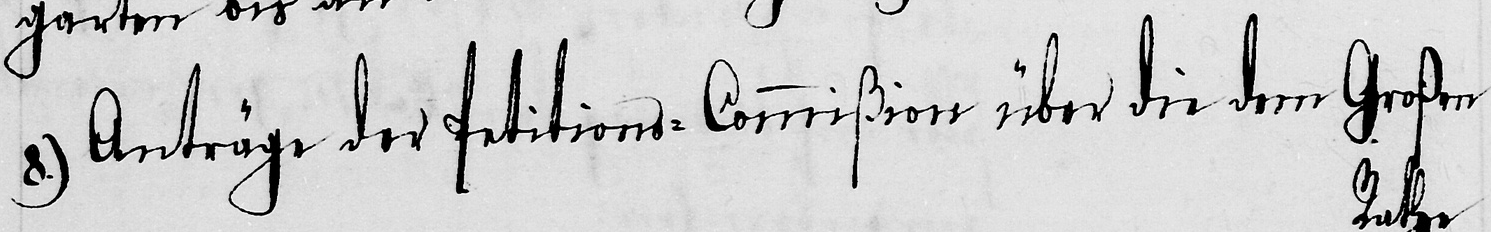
8.) Anträge der Petitions-Commißion über die dem Großen
